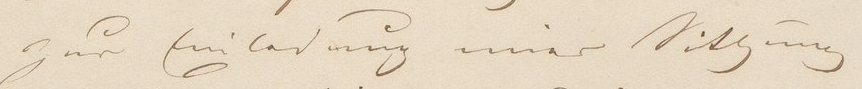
zur Einladung einer Sitzung
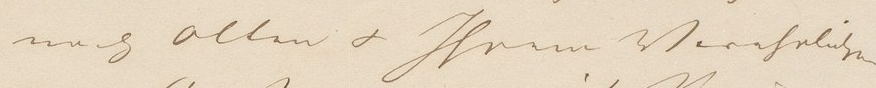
nach Olten & Ihrem Verehrlichen
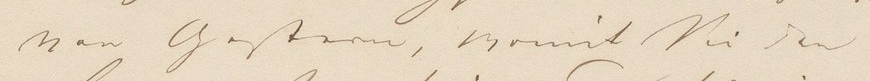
von Gestern, womit Sie den
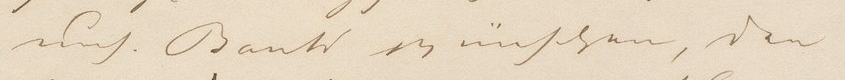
uns. Bank erwünschen, den
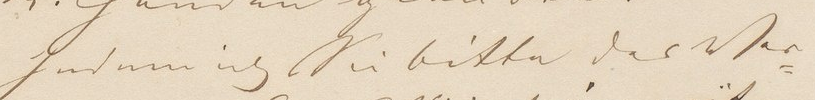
Indem ich Sie bitte das Ver-
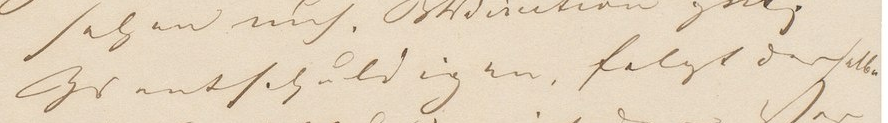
zu entschuldigen, folgt derselben
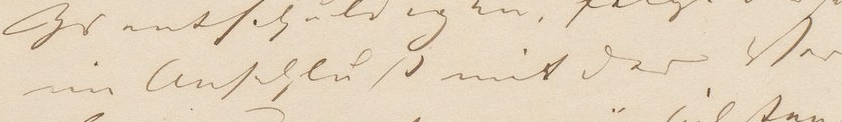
im Anschluß mit der Ver-
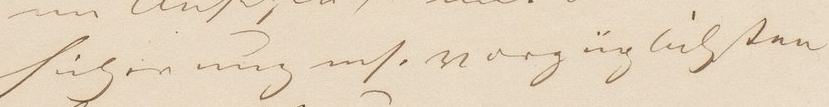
sicherung m. vorzüglichsten
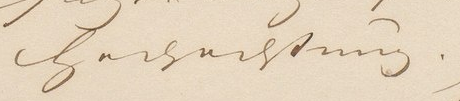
Hochachtung.
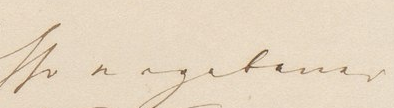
Ihr ergebener
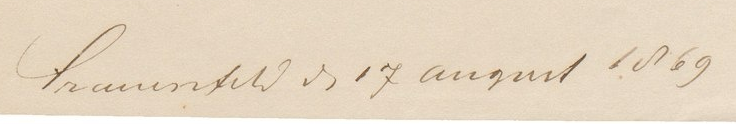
Frauenfeld den 17 August 1869
